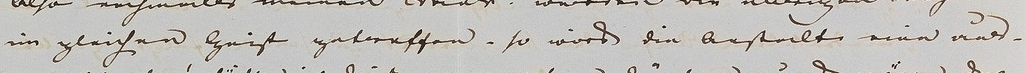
im gleichen Geist getroffen – so wird die Anstalt eine aus-
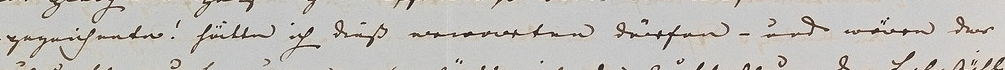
gezeichnete! hätte ich dieß erwarten dürfen – und wäre der
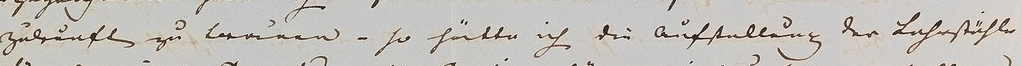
Zukunft zu trauen – so hätte ich die Aufstellung der Lehrstühle
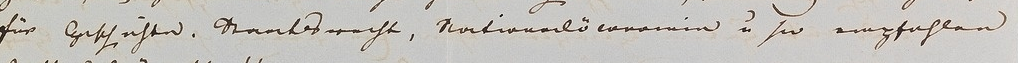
für Geschichte, Staatsrecht, Nationalöconomie usw empfohlen
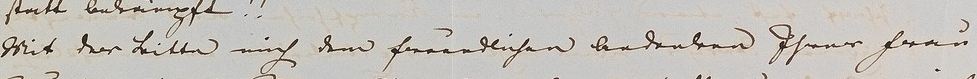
Mit der Bitte mich dem freundlichen Andenken Ihrer Frau
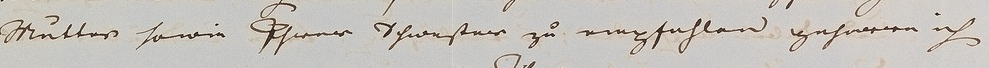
Mutter sowie Ihrer Schwester zu empfehlen geharre ich
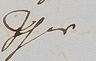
Ihr
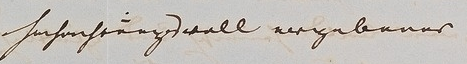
hochachtungsvoll ergebener
